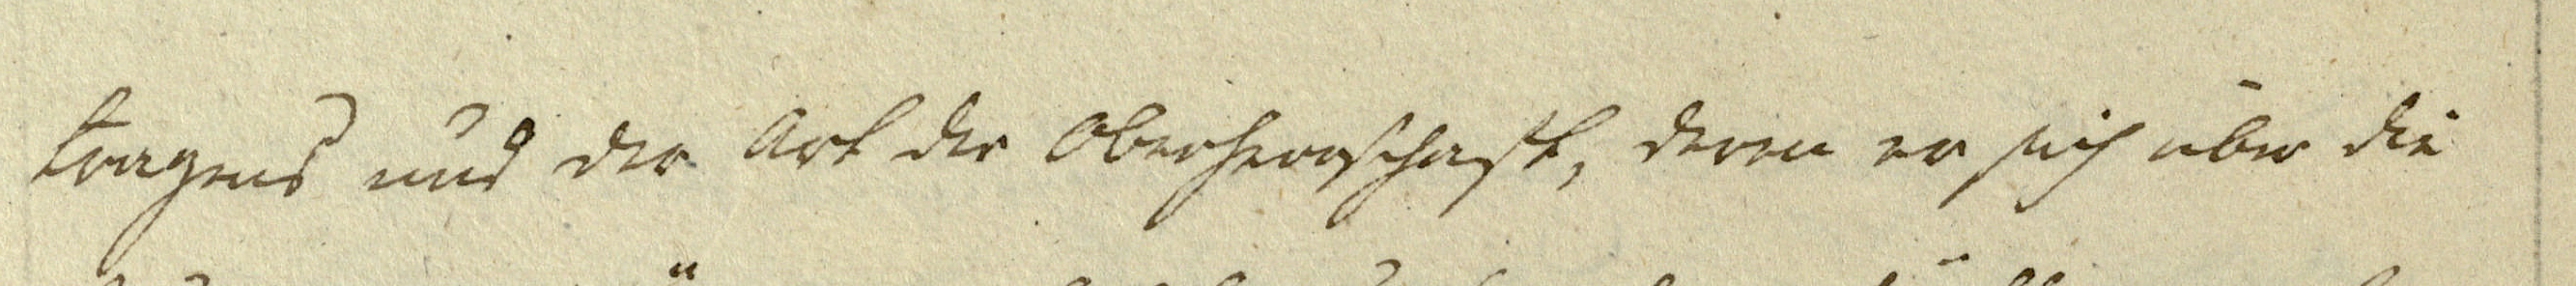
tragens und der Art der Oberherrschaft, deren er sich über die
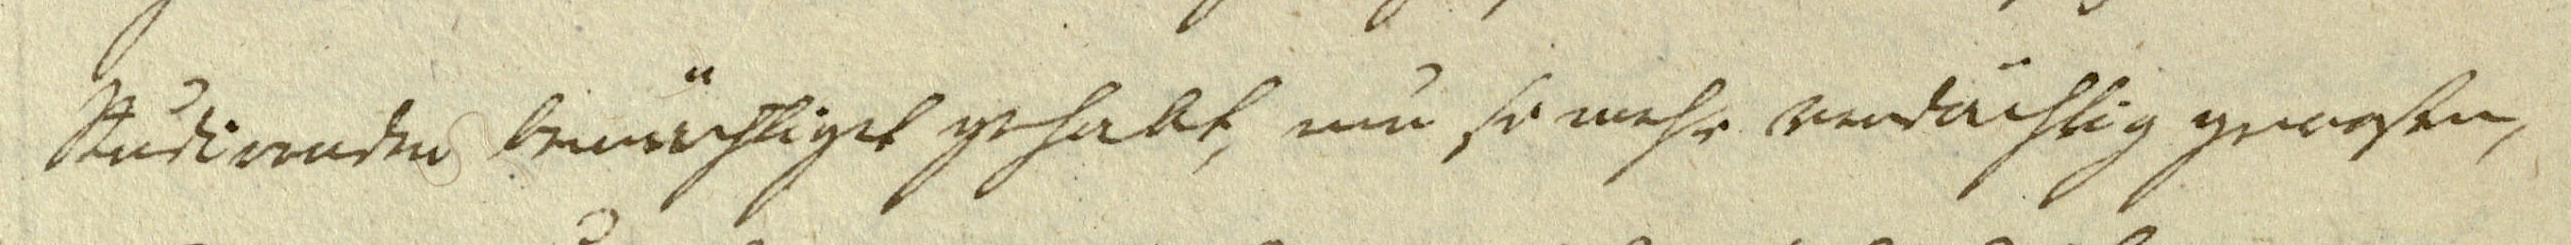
Studirenden bemächtiget gehabt, um so mehr verdächtig gewesen,
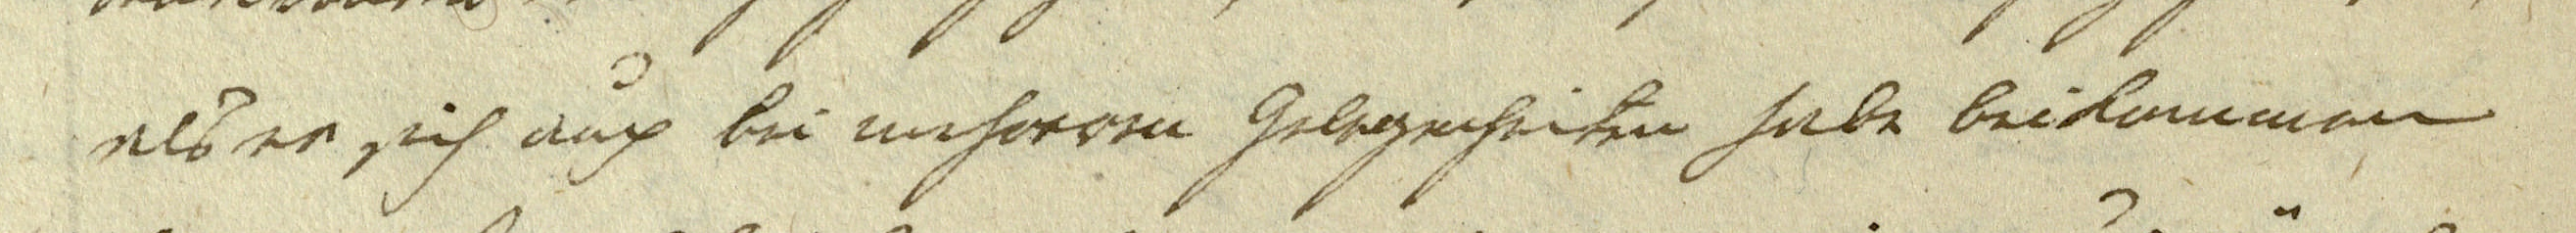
als er sich auch bei mehreren Gelegenheiten habe beikommen
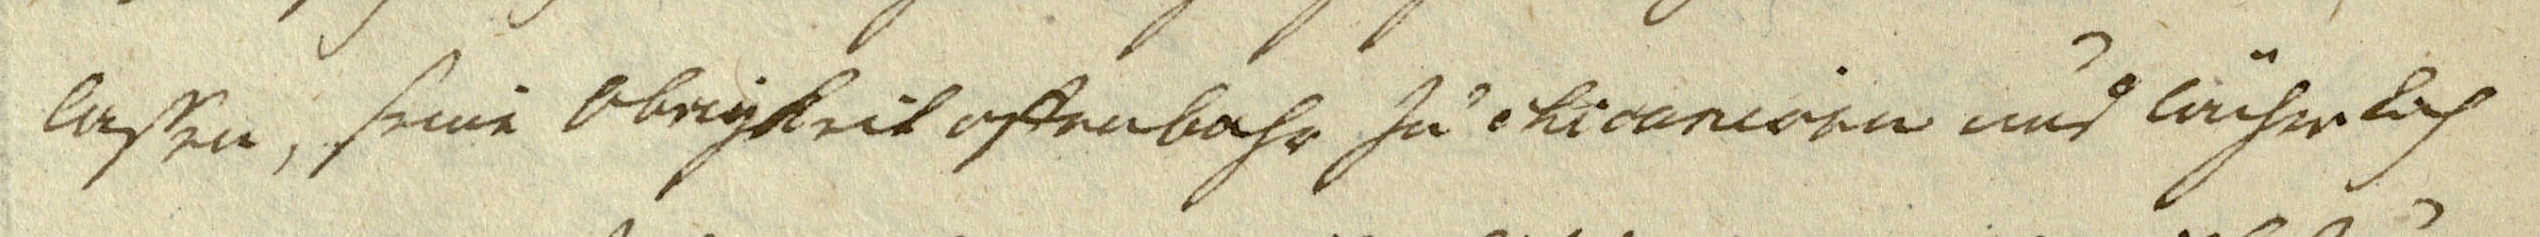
lassen, seine Obrigkeit offenbahr zu chicaniren und lächerlich
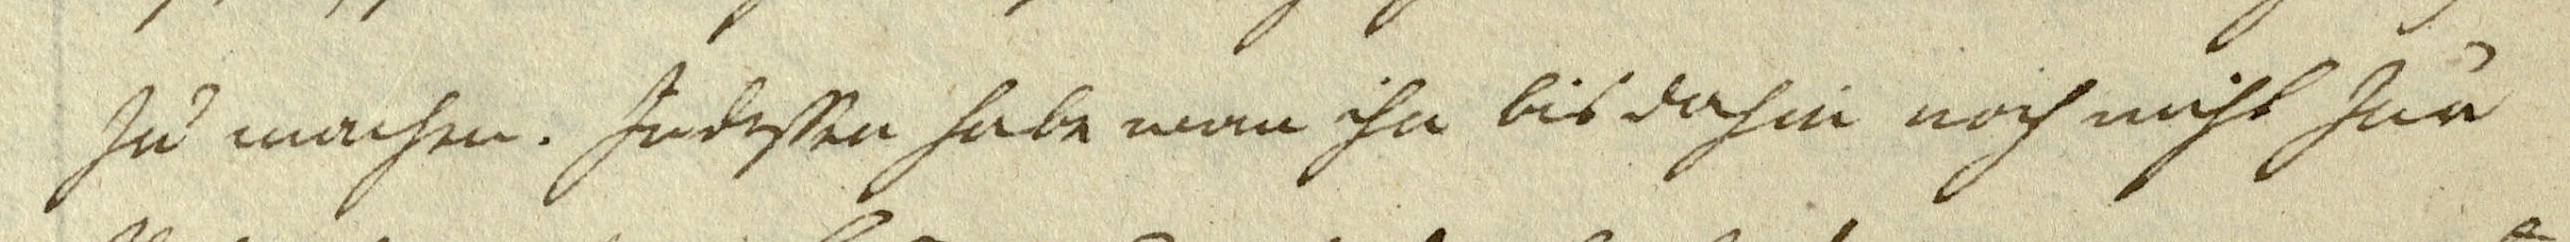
zu machen. Indessen habe man ihn bis dahin noch nicht zur
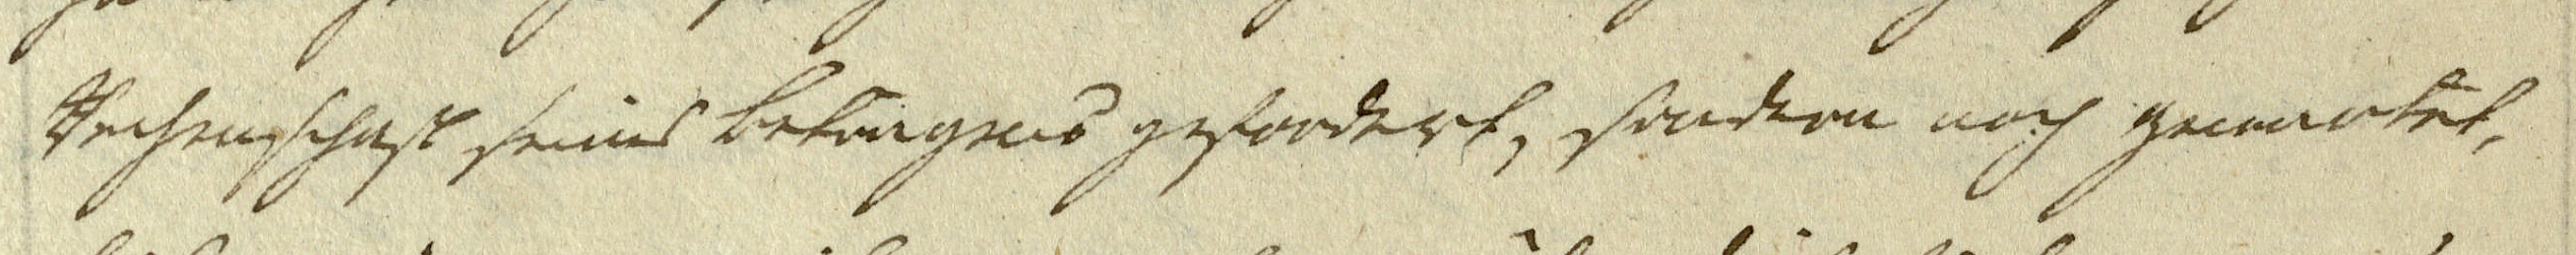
Rechenschaft seines Betragens gefordert, sondern noch gewartet,
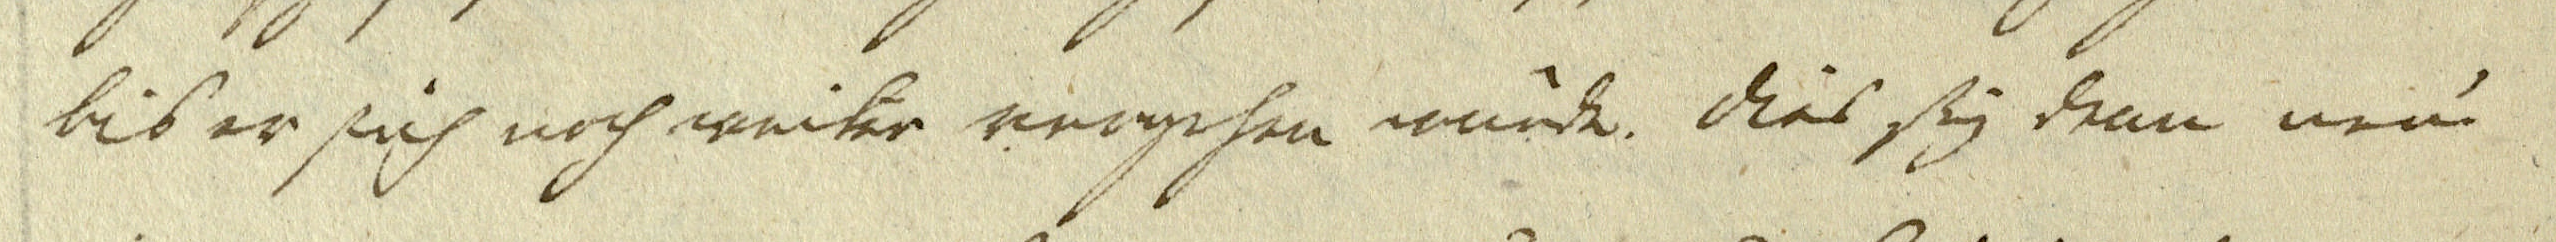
bis er sich noch weiter vergehen würde. Dies seÿ denn neu¬
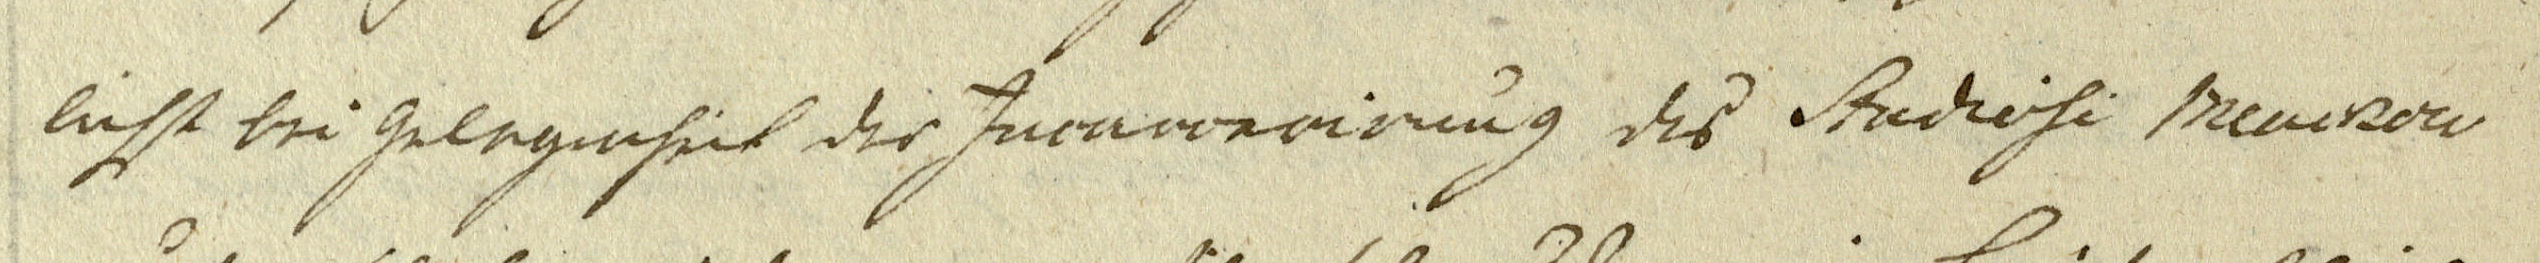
lichst bei Gelegenheit der Incarcerirung des Studiosi Menckow
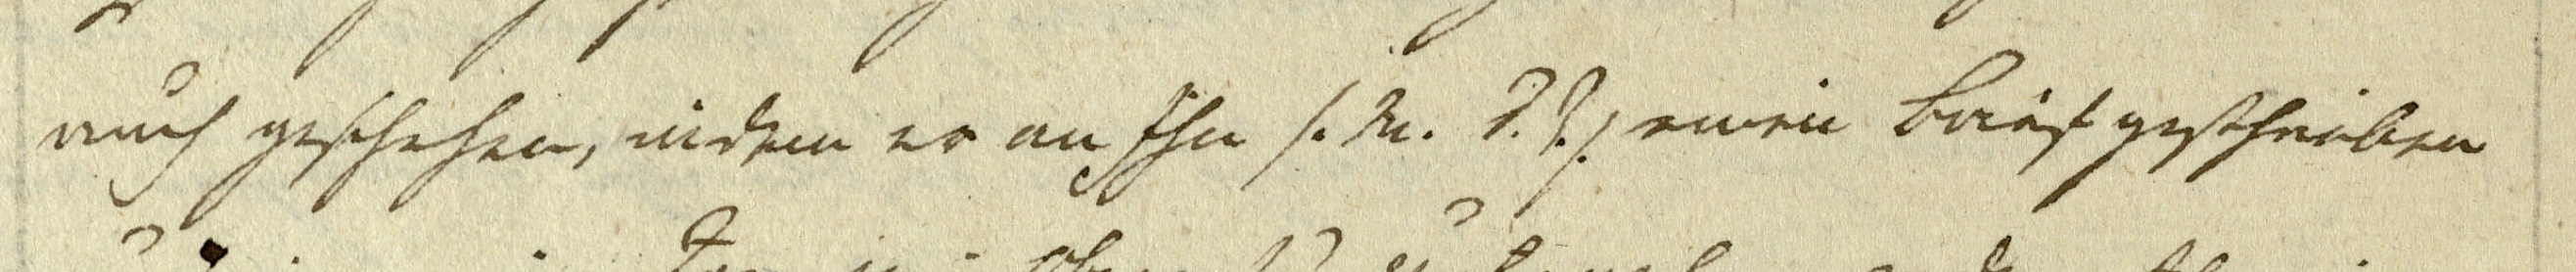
auch geschehen, indem er an Ihn /. M. 1. J./, einen Brief geschrieben
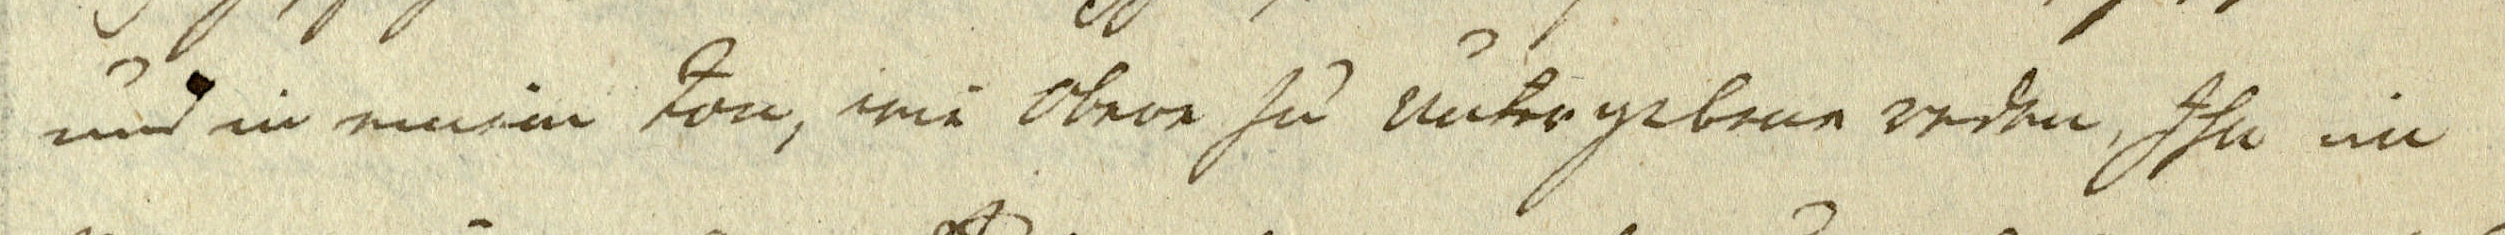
und in einem Ton, wie Obere zu Untergebene reden, Ihn im
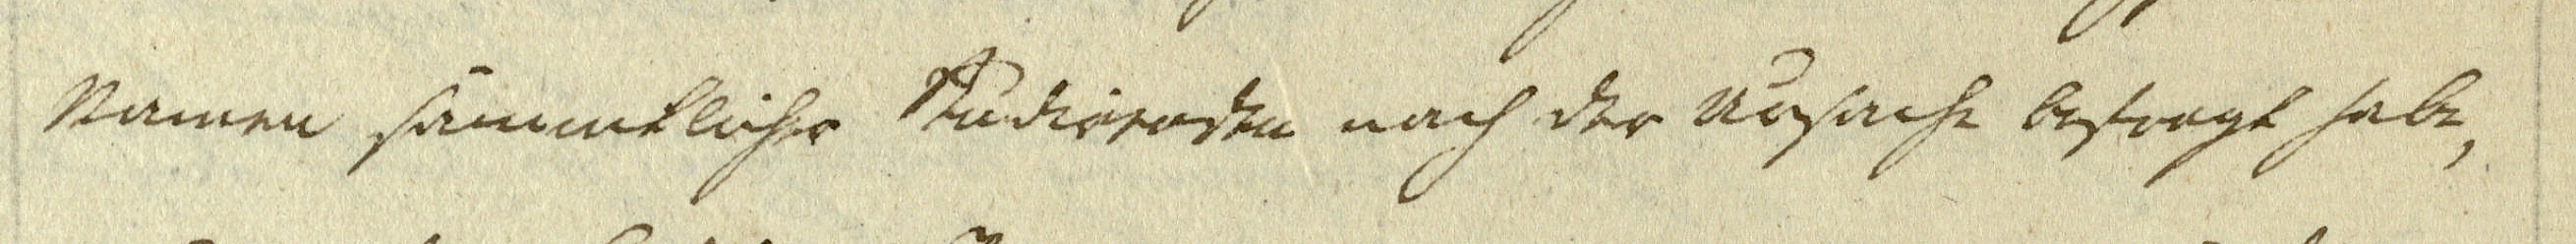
Namen sämmtlicher Studirenden nach der Ursache befragt habe,
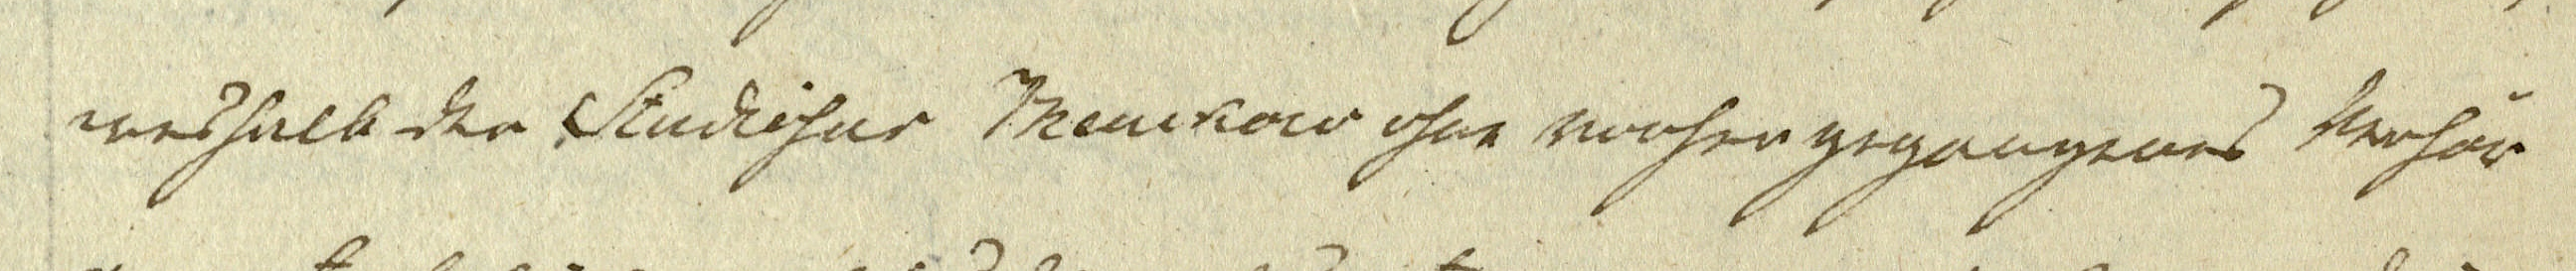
weshalb der Studiosus Menckow ohne vorher gegangenes Verhör
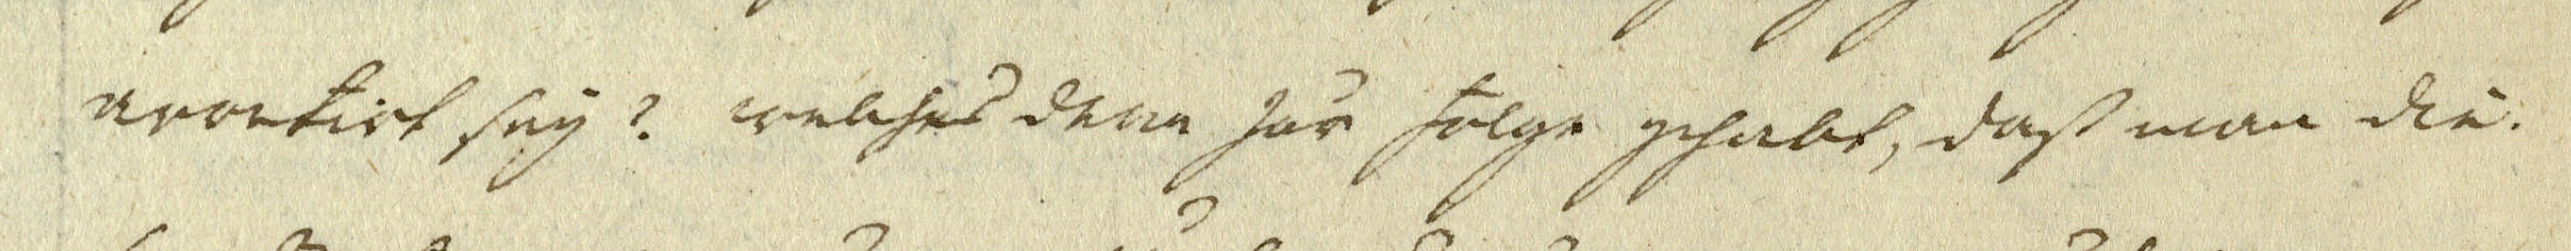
arretirt seÿ ? Welches denn zur Folge gehabt, daß man die¬
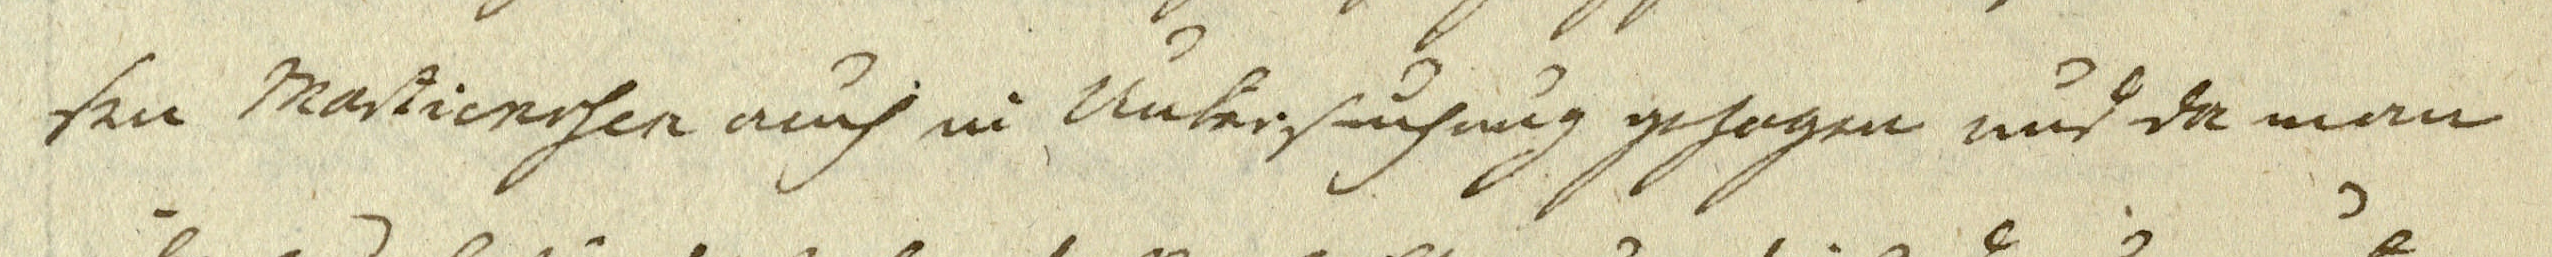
sen Martienssen auch in Untersuchung gezogen und da man
